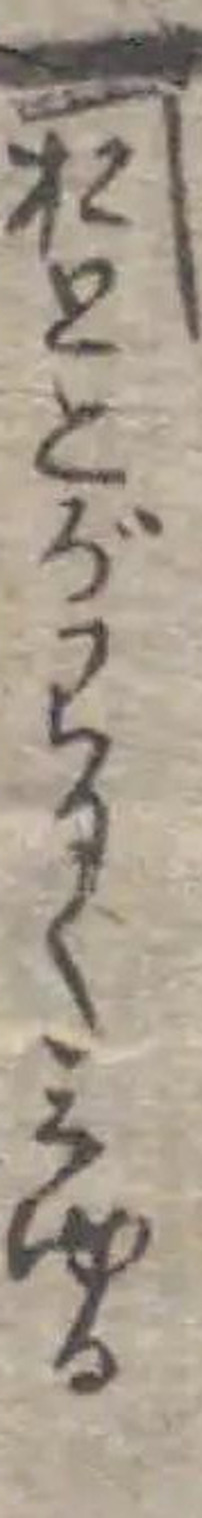〽おとこがわるくみゆる
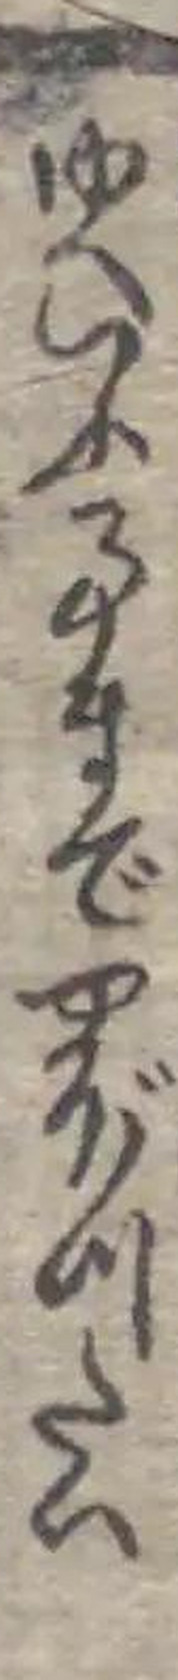ゆへいふ事までやぼつたい
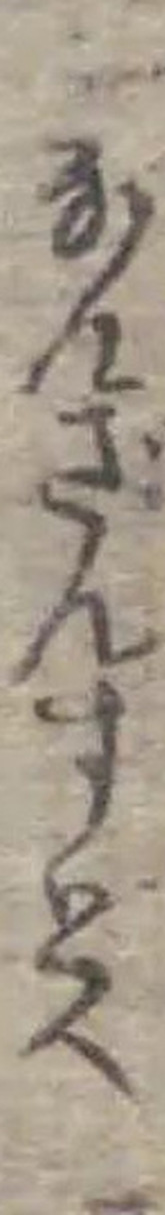〽なんざんすとへ
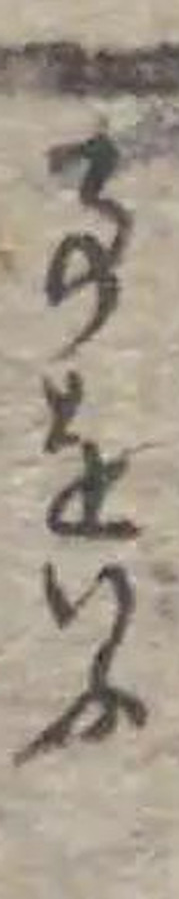事をいふ
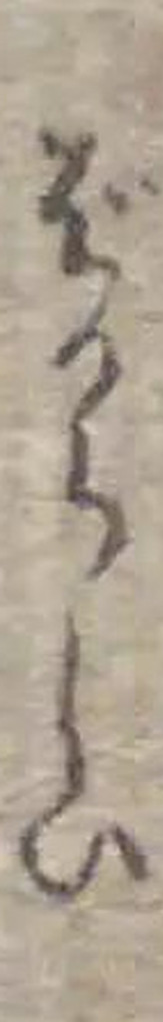ばからしい

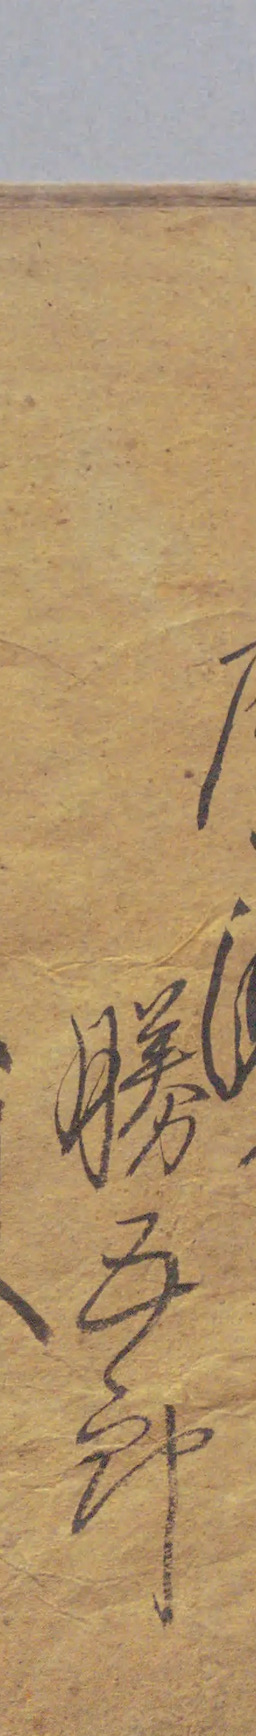勝五郎
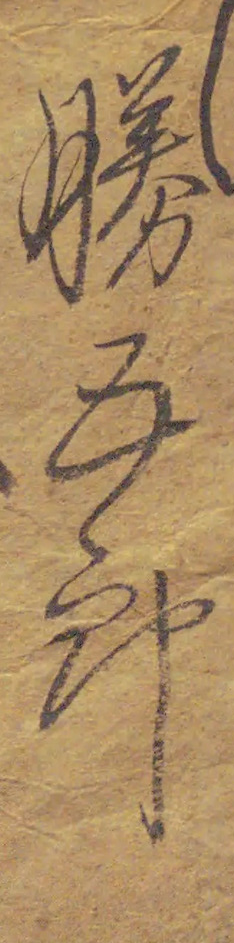勝五郎
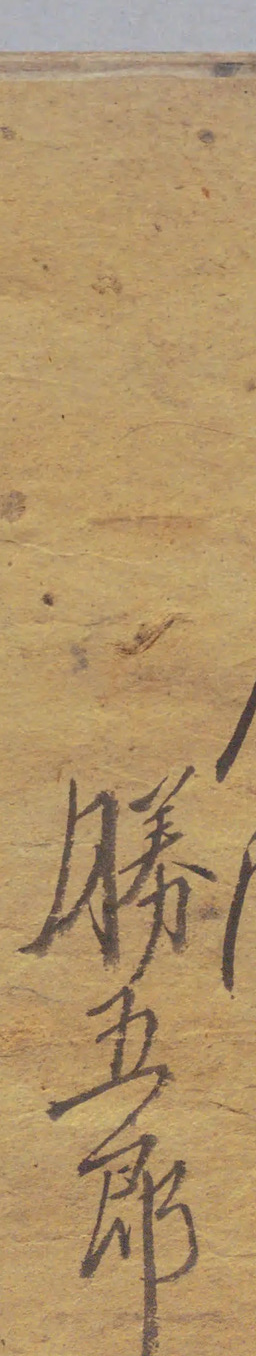勝五郎
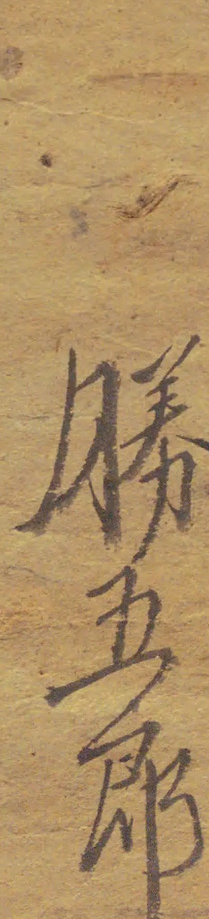勝五郎
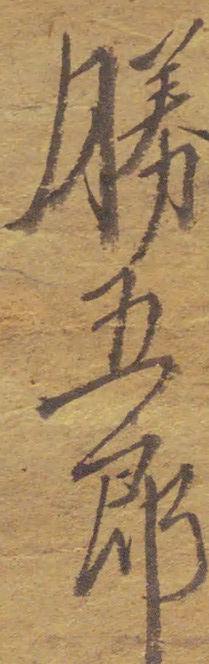勝五郎
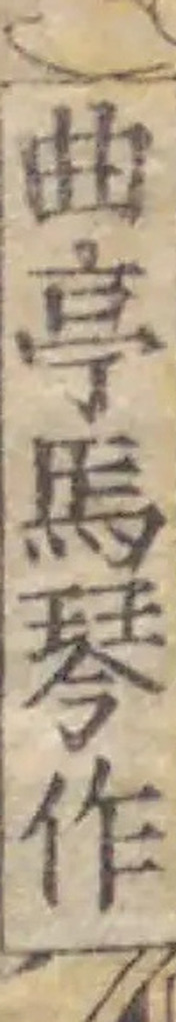曲亭馬琴作

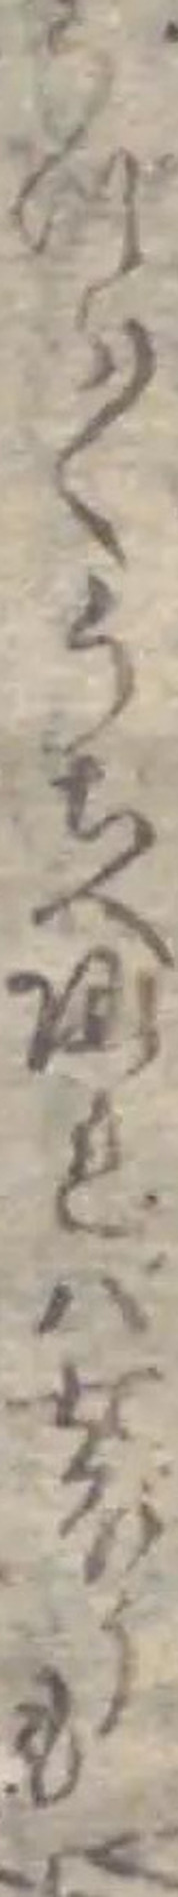うつら〴〵うちへ帰れば女ぼうも
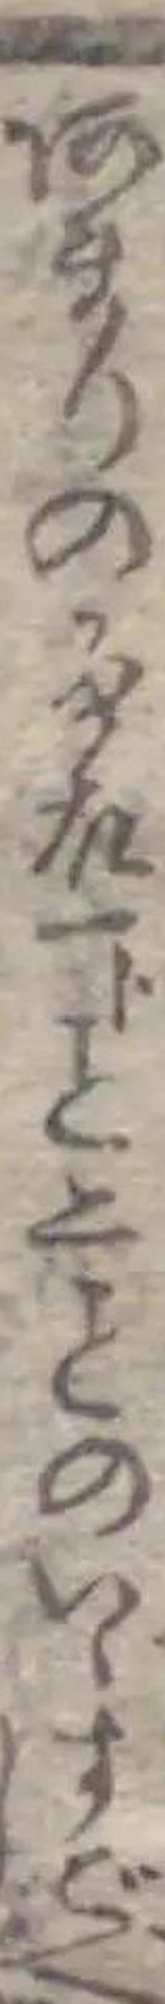あまりの子と故一二ことのいゝすご
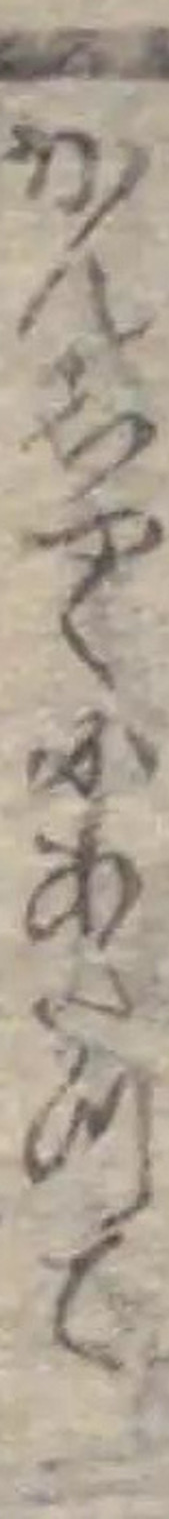かんしやくにあたつて
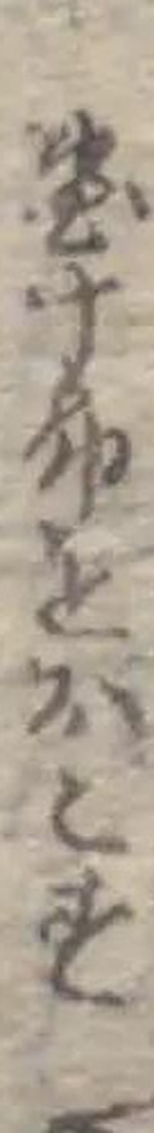団十郎をおこす
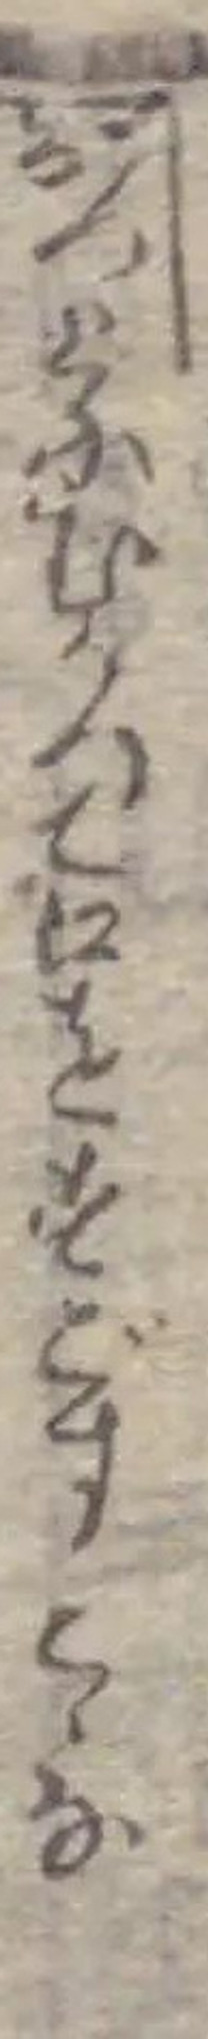〽おつとにむかつて口をすごすこゝな
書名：福壽海旡量品玉 3巻
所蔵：国立国会図書館 National Diet Library, JAPAN
